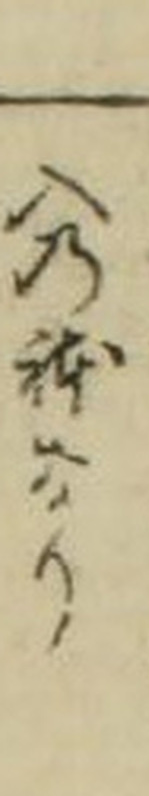入の体なり
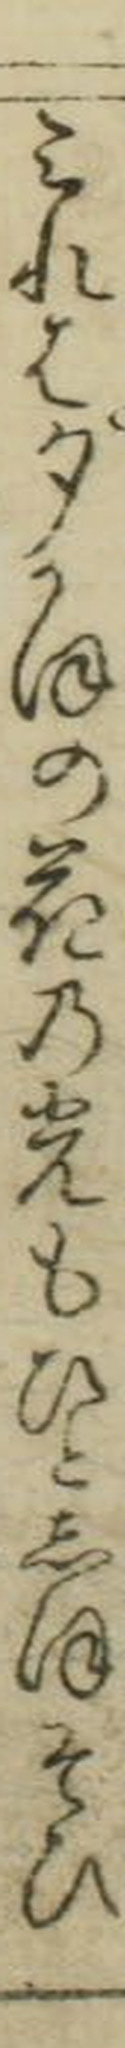みれは。夕かほの花の光もひとしほそひ
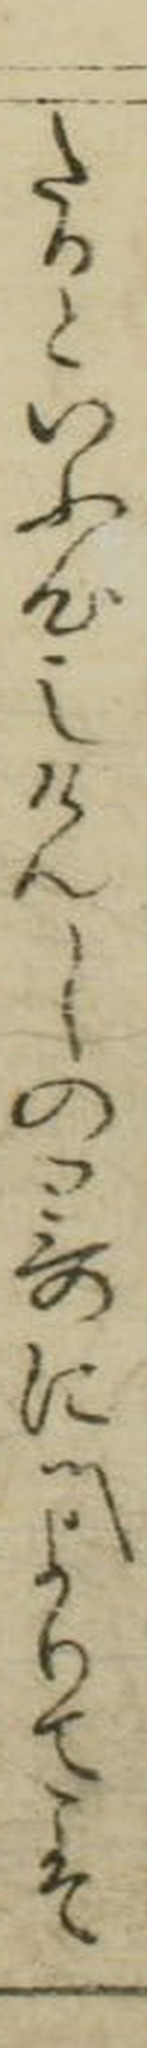たるといふ心也けんしの御哥に〽よりてこそ
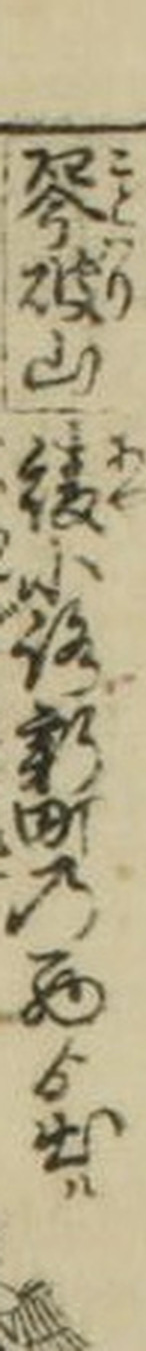琴破山綾小路新町の西より出
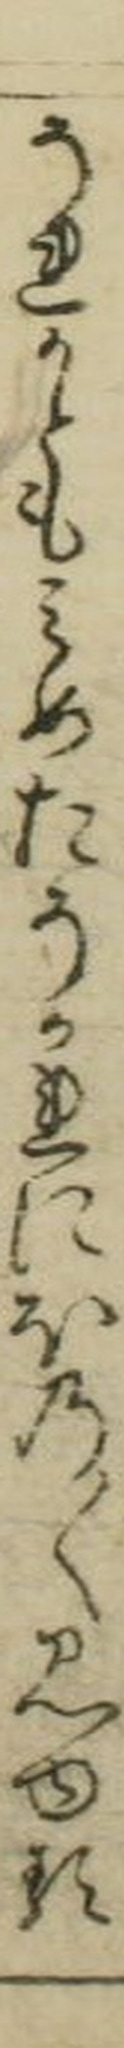それかともみめたそかれにほの〳〵見ゆる
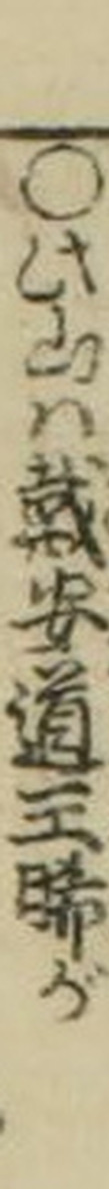○此山は戴安道王晞が
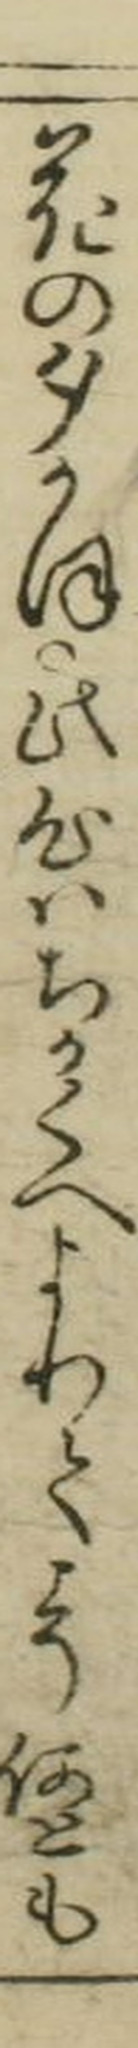花の夕かほ○此心はちかくへよりてこそ何とも
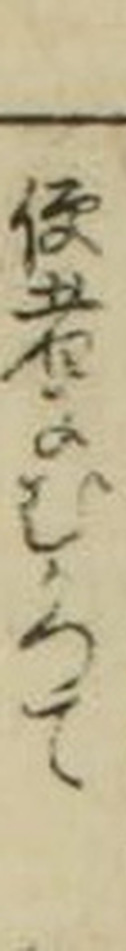使者にむかつて
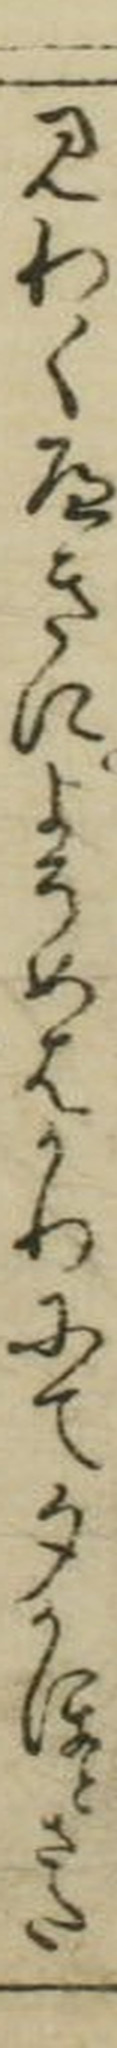見わくへきに。よそめはかりにて夕かほとさた
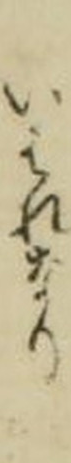いはれなり
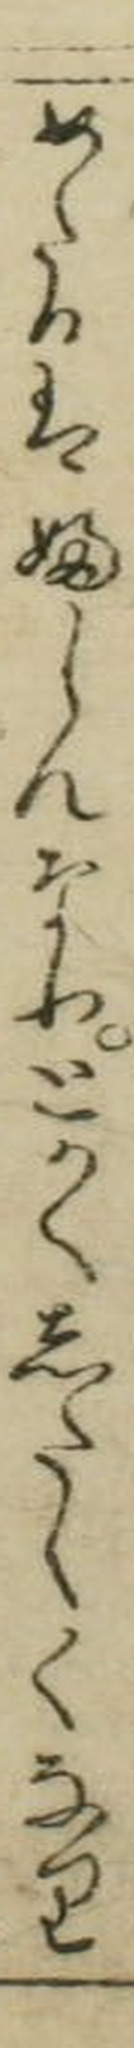めたるはふしんなり。とかくしたしくなり
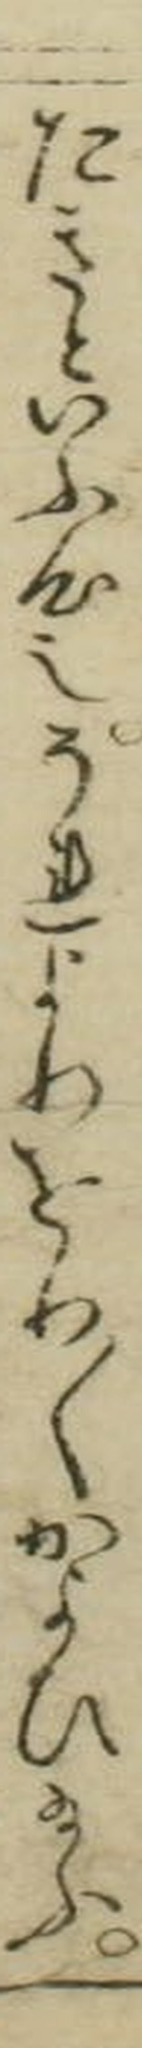たきといふ心也。それよりをり〳〵かよひ給ふ。
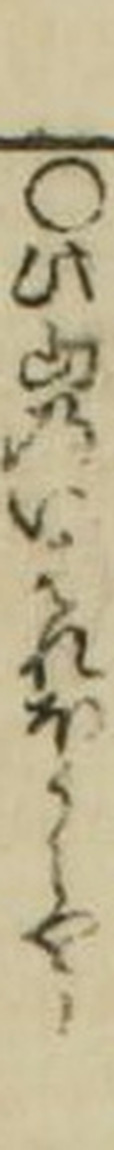○此山のいはれほうしやう
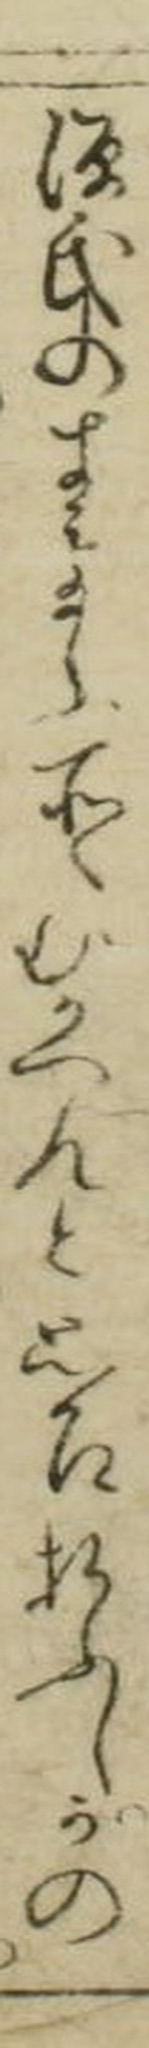源氏のすみ給ふ所へむかへんと思召折ふし。かの
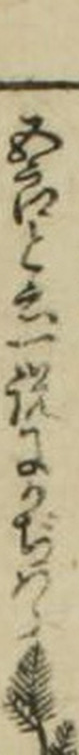五郎と云一説にかぢはら
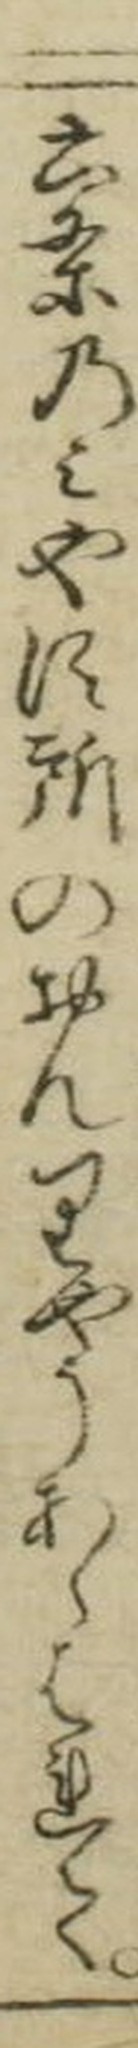六条のみやす所のおんりやうあらはれて。
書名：女源氏教訓鑑
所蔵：東京学芸大学附属図書館
